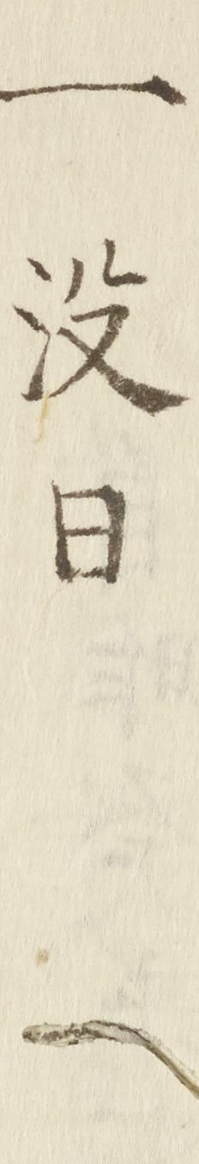一没日
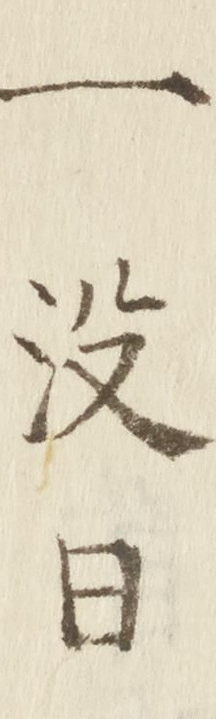一没日
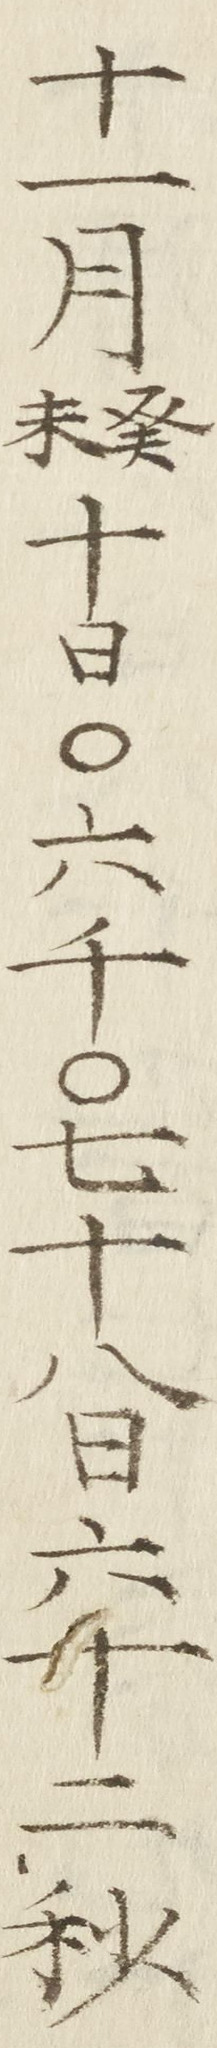十一月癸未十日〇六千〇七十八日六十二秒
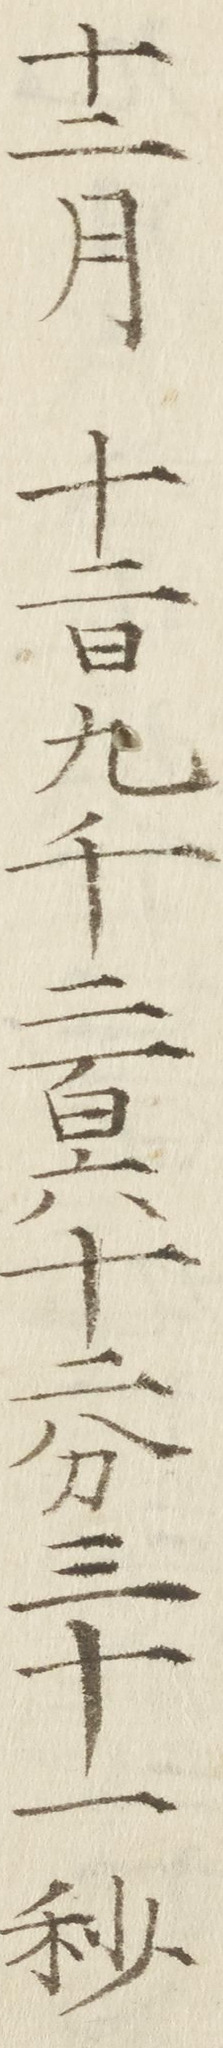十二月十二日九千二百六十二分三十一秒
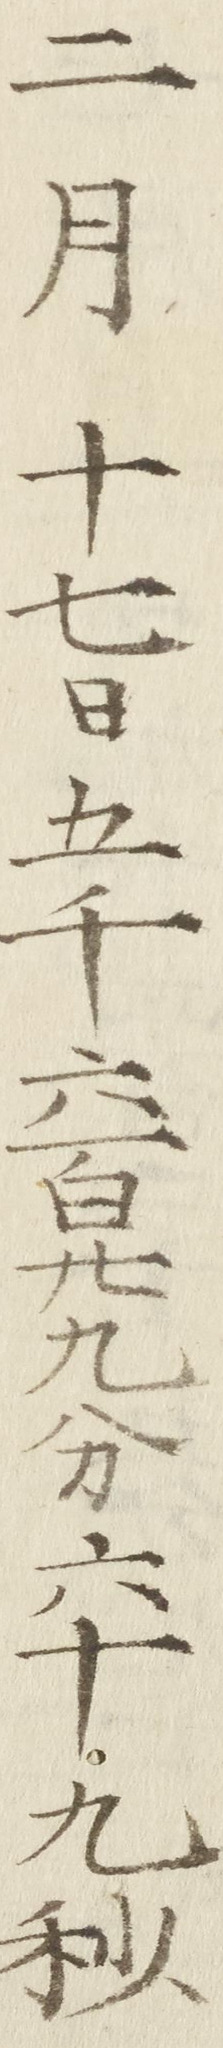二月十七日五千六百廿九分六十九秒
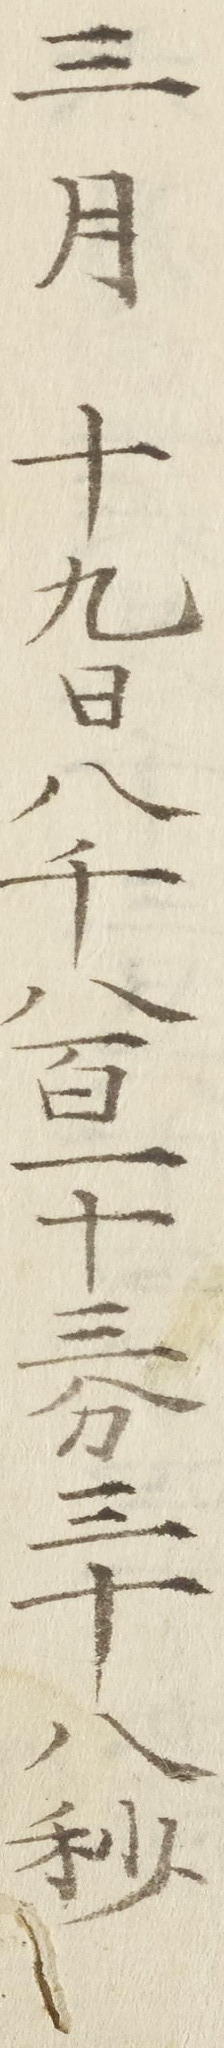三月十九日八千八百一十三分三十八秒
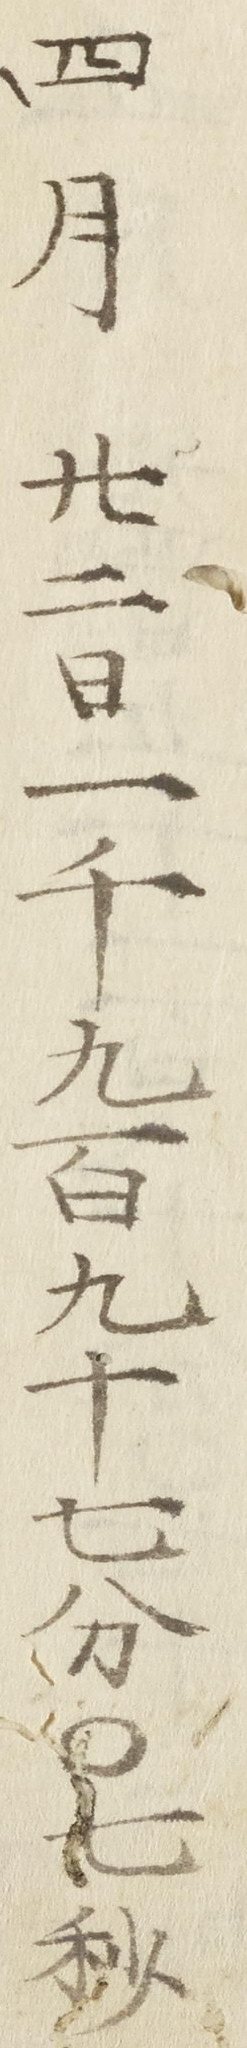四月廿二日一千九百九十七分〇七秒

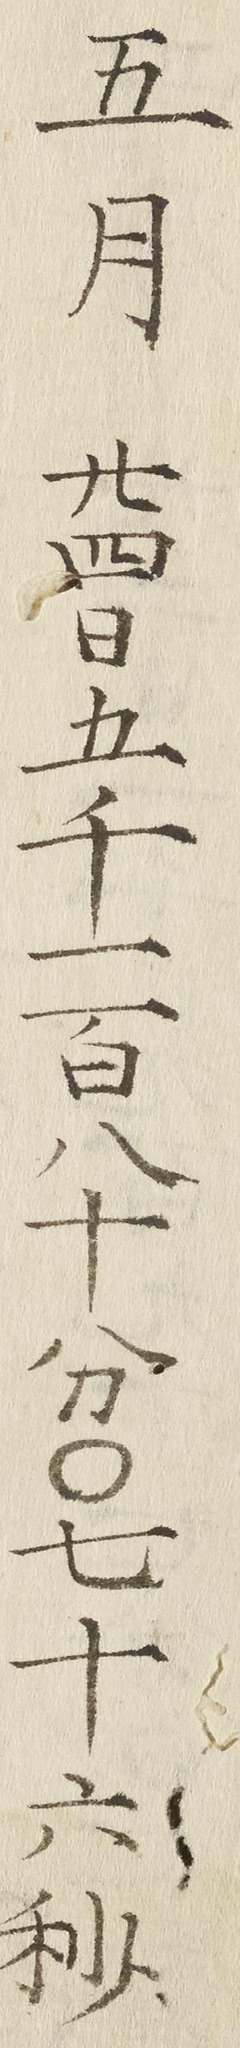五月廿四日五千一百八十分〇七十六秒
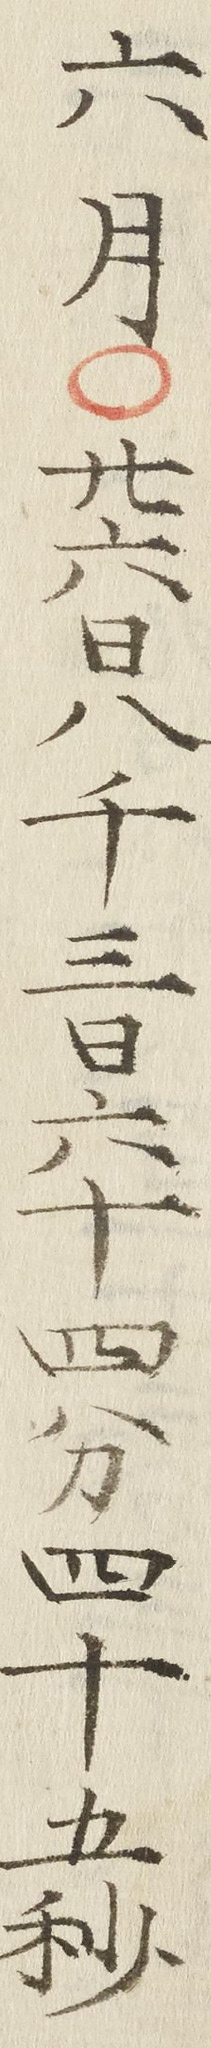六月○廿六日八千三日六十四分四十五秒
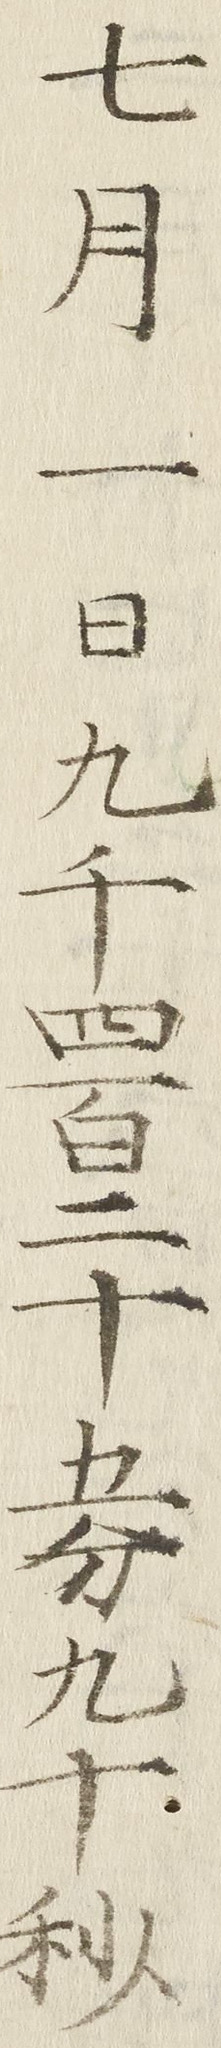七月一日九千四百二十五分九十秒
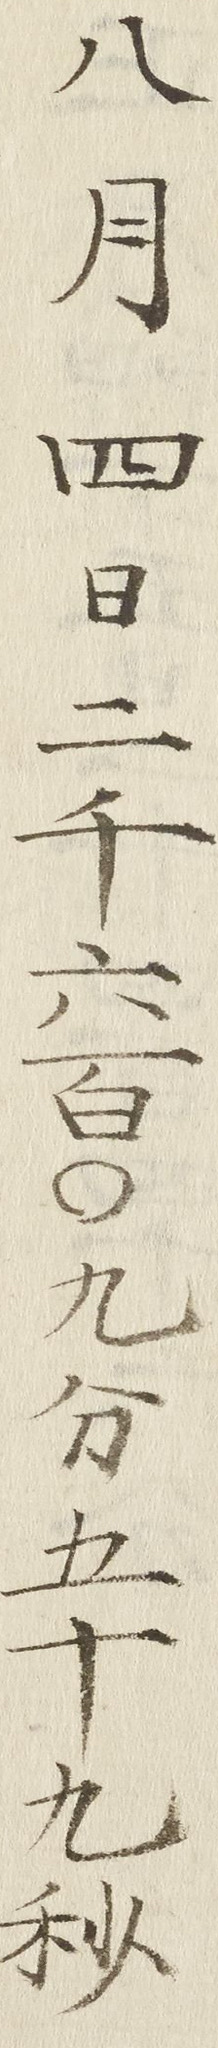八月四日ニ千六百〇九分五十九秒
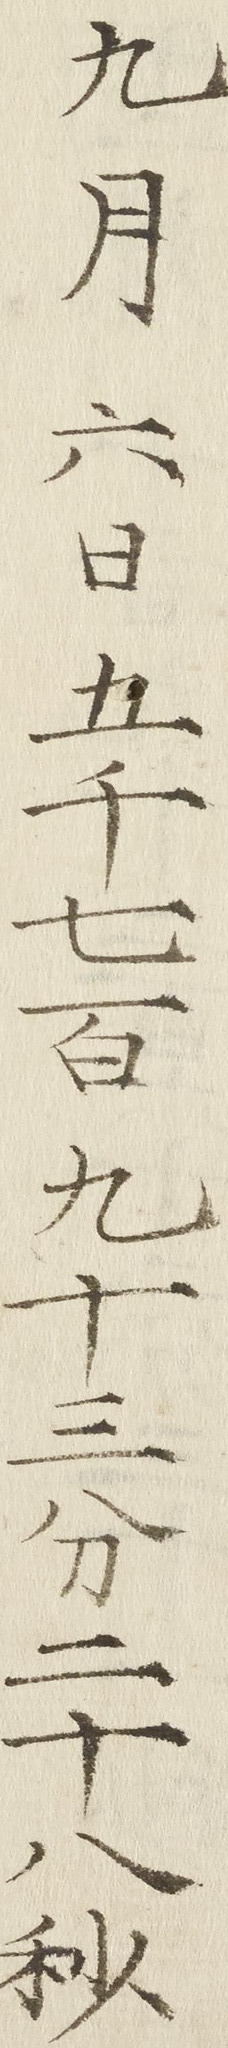九月六日五千七百九十三分二十八秒
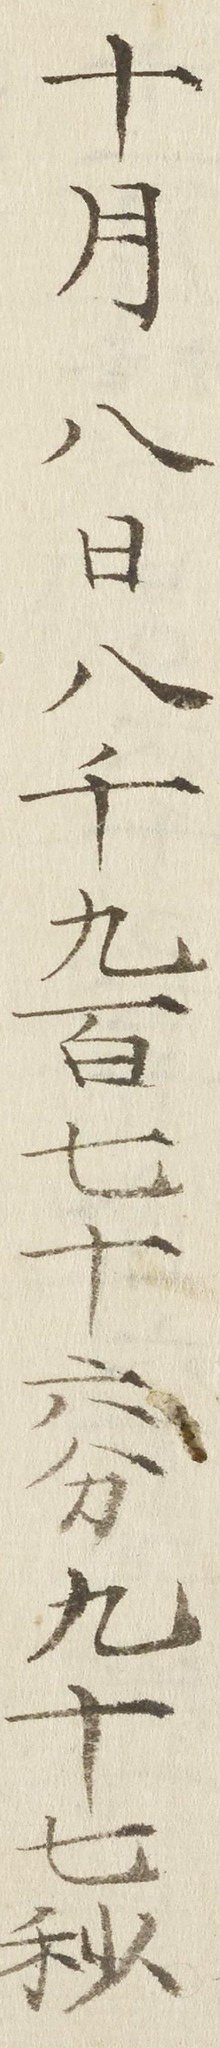十月八日八千九百七十六分九十七秒
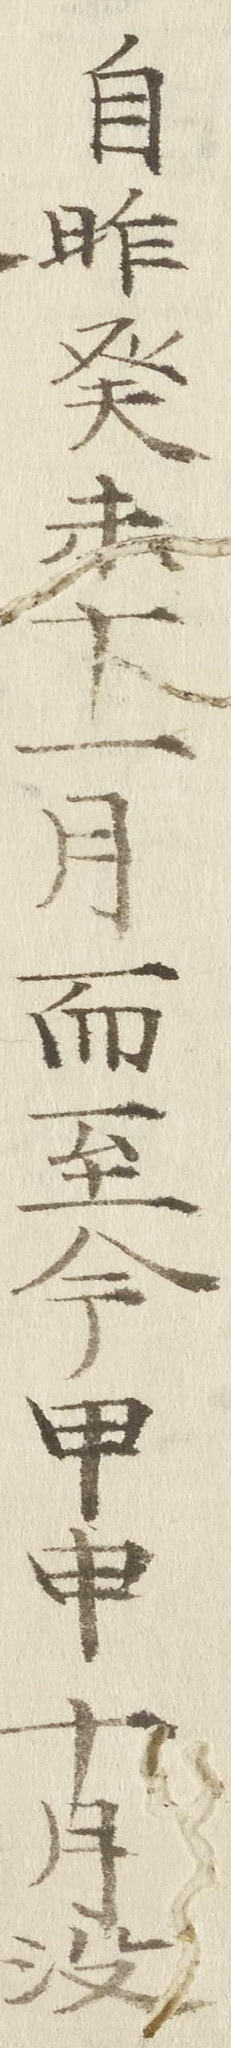自昨癸未十一月而至今甲申十月没
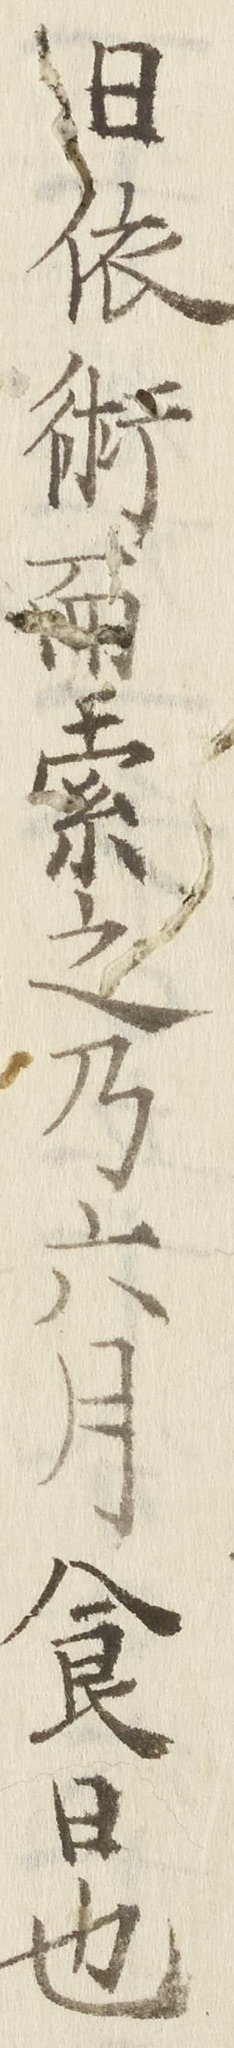日依術而索之及六月食日也
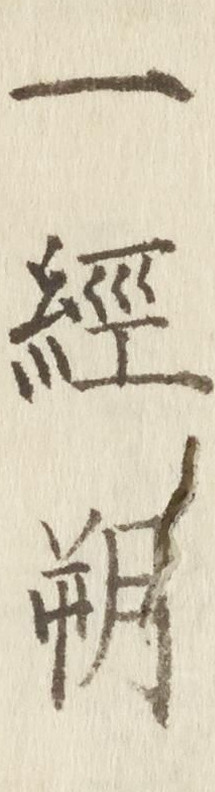一経朔
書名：日食度
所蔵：東京大学地震研究所図書室 Earthquake Research Institute Library, The University of Tokyo, JAPAN
